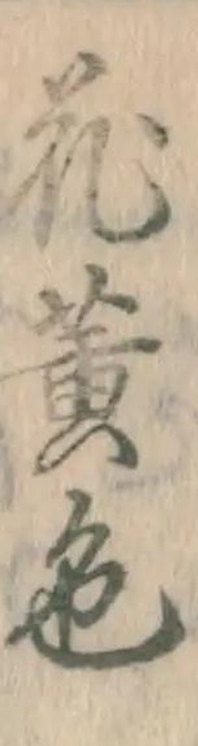花黄色

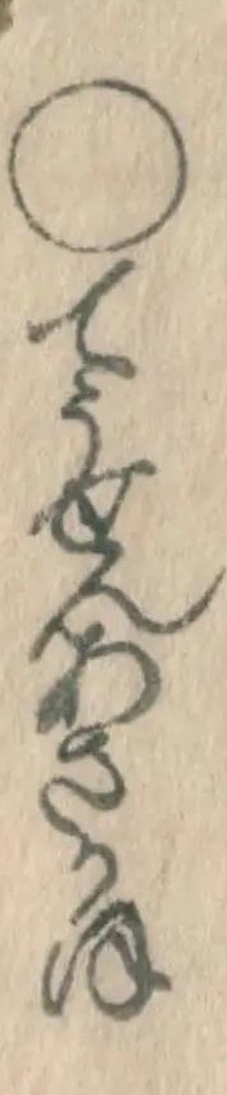〇てうせんあさかほ
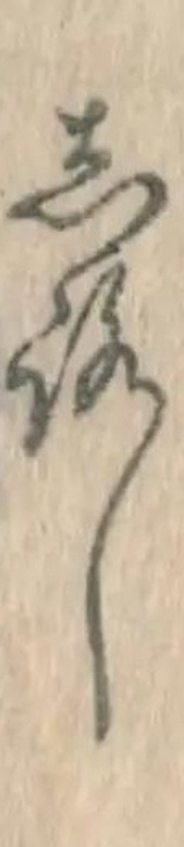しろく
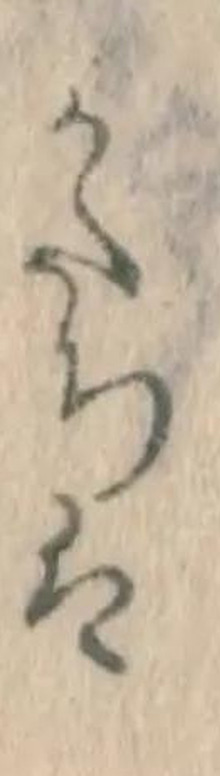かたちは
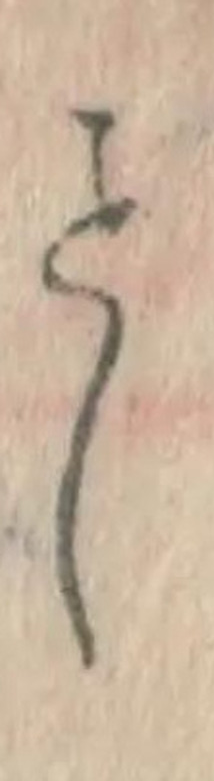ことし
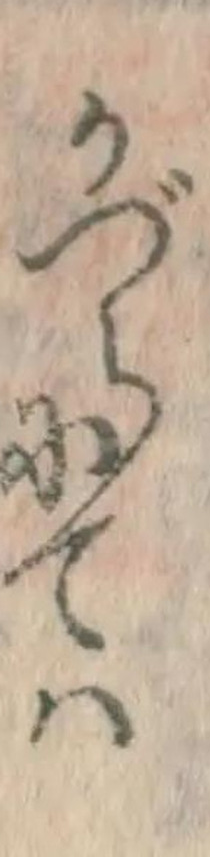かづらにては
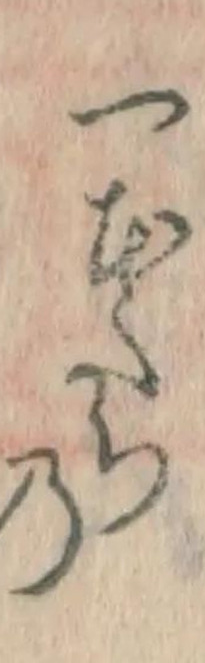一本たちの
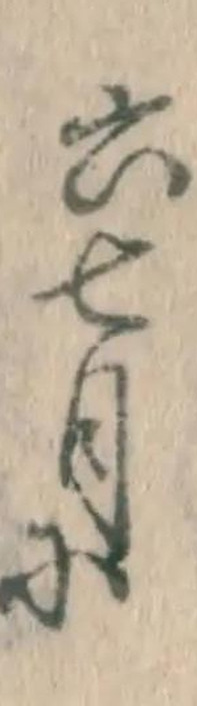六七月に
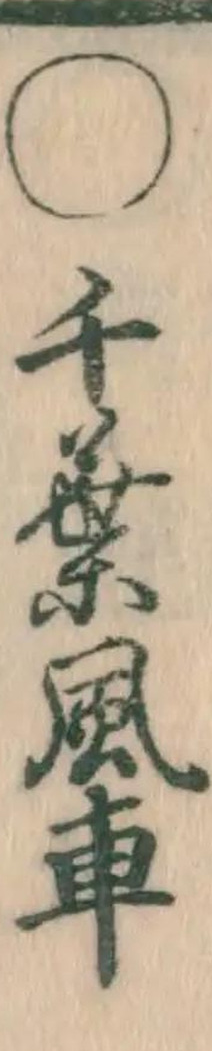〇千葉風車
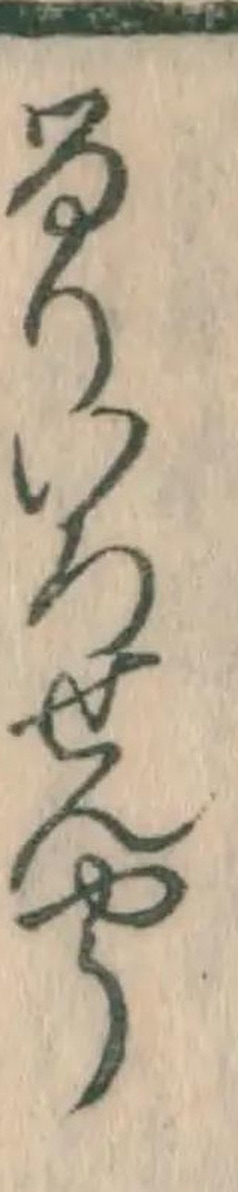るりいろせんやう
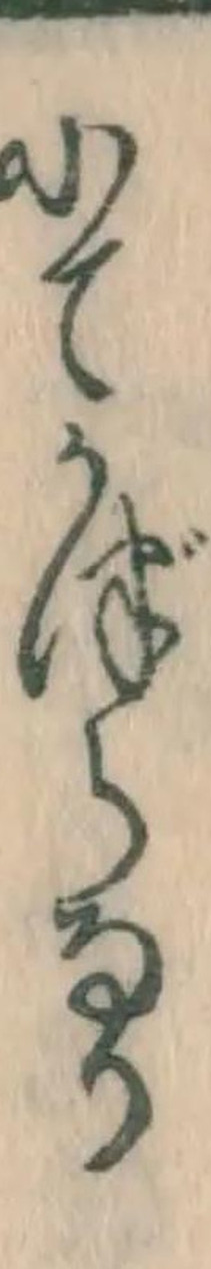にてかづらなり

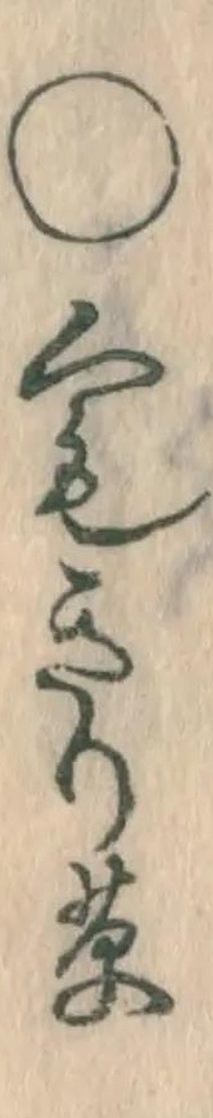〇くもきり草
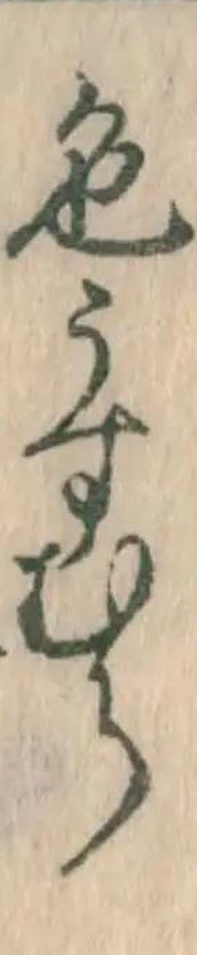色うすむら
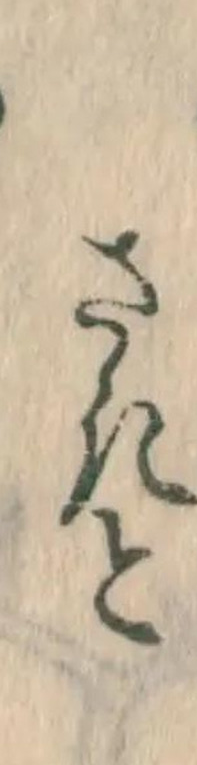さきと
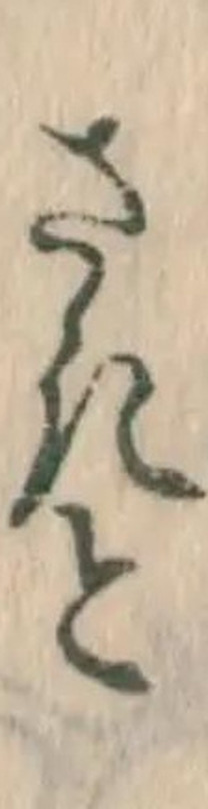さきと
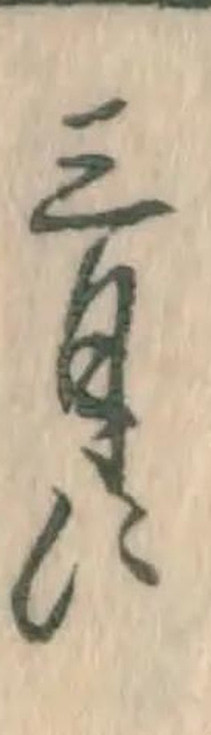三月に
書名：艸花繪前集. [2]
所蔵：国立国会図書館 National Diet Library, JAPAN
